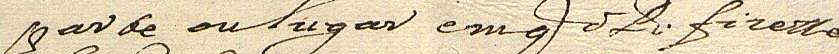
parte ou lugar em q̄ o R. fizesse
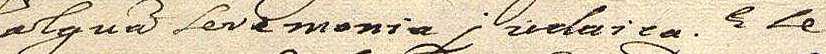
alguā seremonia judaica. E se
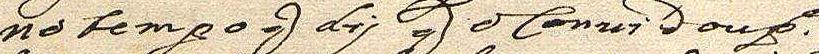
no tempo q̄ dis q̄ o Conuidou p.a
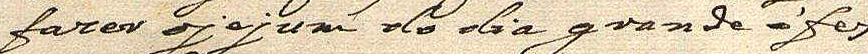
fazer o jejum do dia grande o fes
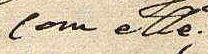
com elle;
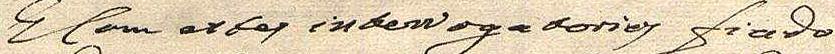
E Com estes interrogatorios fiado
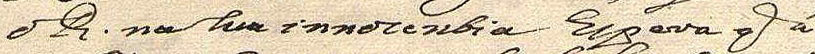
o R. na sua innocentia Espera q̄ á
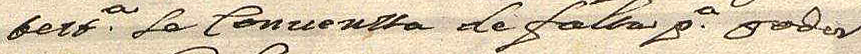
test.a se Conuenssa de falca p.a poder
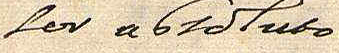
ser absoluto
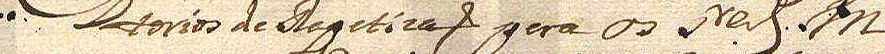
torios de Repetiçaõ pera os sres. In
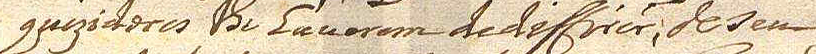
quizidores lhe hauerem de diffirir, de seu
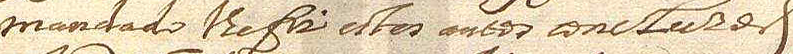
mandado lhe fiz estes autos concLuzos
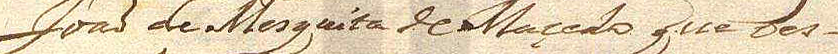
Joaõ de Mesquita de Maçedo que o es
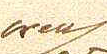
creuj
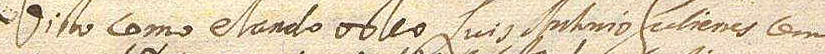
Visto como estando o Reo Luis Antonio Gutierres com
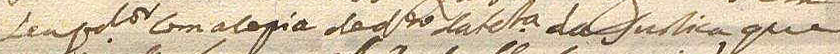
seu p.dor com a copia do dto da test.a da Justiça que
